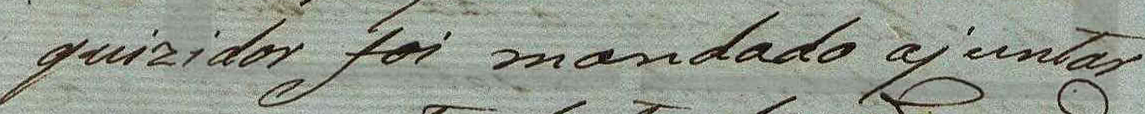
quizidor foi mandado ajuntar
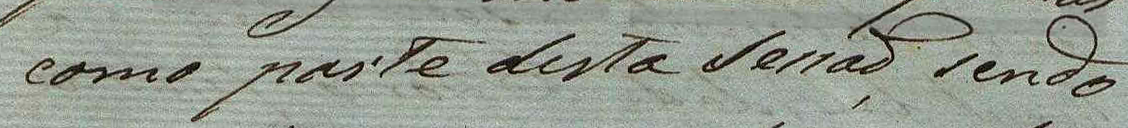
como parte desta sessaõ, sendo
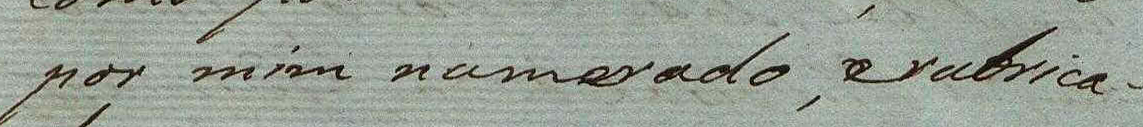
por mim numerado, e rubrica
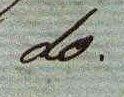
do.
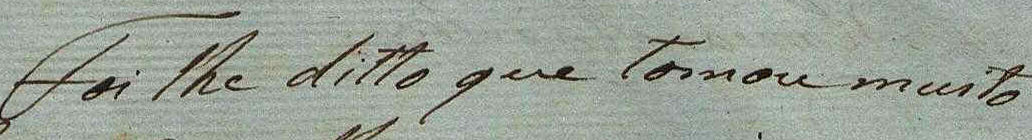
Foi lhe ditto que tomou muito
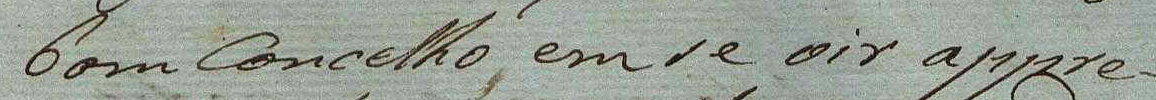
bom Concelho, em se vir appre
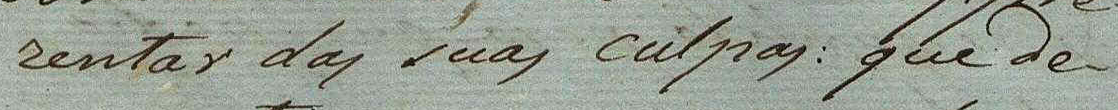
zentar das suas culpas: que de
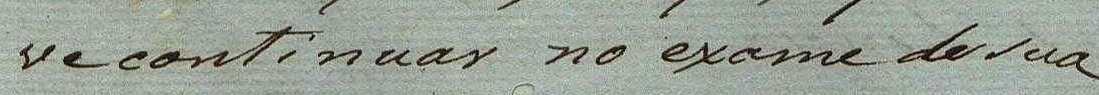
ve continuar no exame de sua
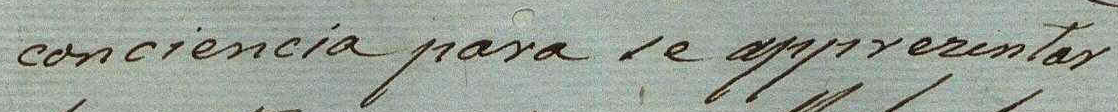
conciencia para se apprezentar
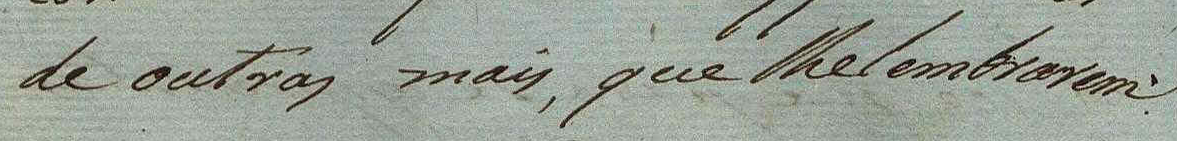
de outras mais, que lhe lembrarem
